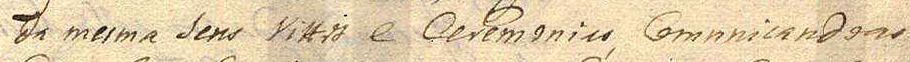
da mesma seus rittos e Ceremonias, Comunicandoas
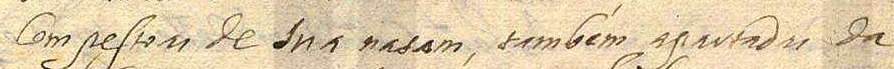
Com pessoas de sua nasam, tambem apartadas da
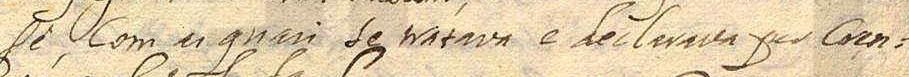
fé, Com as quais se tratava e declaraua por Cren
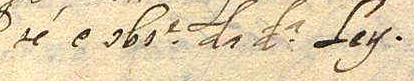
te e obs.e da d̄.a Ley.
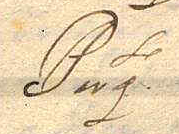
Perq.to
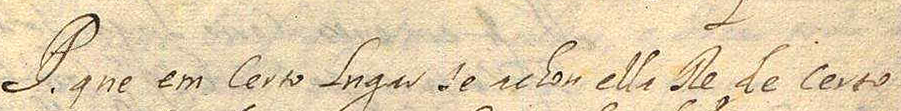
P. que em certo Lugar se achou ella Re, de certo
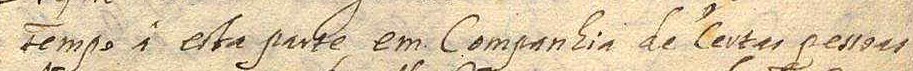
tempo á esta parte em Companhia de certas pessoas
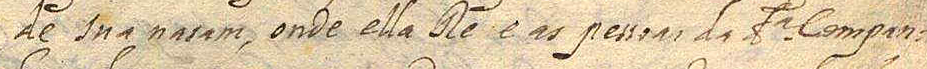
de sua nasam, onde ella Re e as pessoas da d̄.a Compan
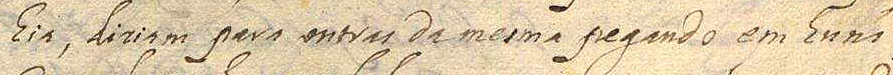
hia, diziam para outras da mesma pegando em huns
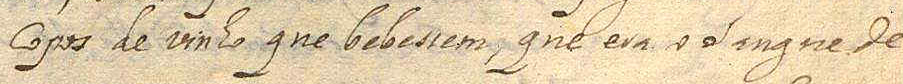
Copos de vinho que bebessem, que era o Sangue de
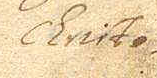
Christo
